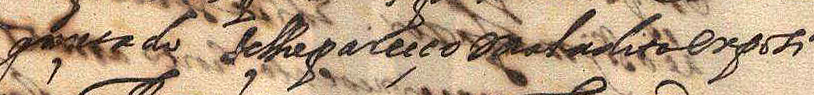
guntado se lhe pareceo mal a dita exposi
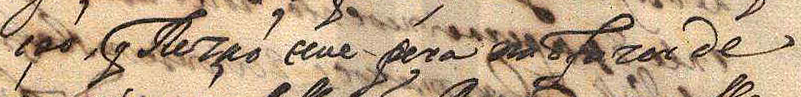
çaõ, q̄ Rezaõ teue pera naõ fazer de
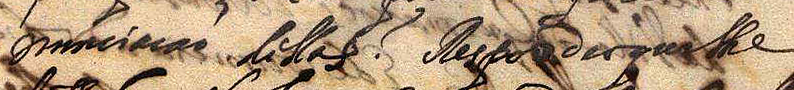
nunciaçaõ dellas? Respondeo que lhe
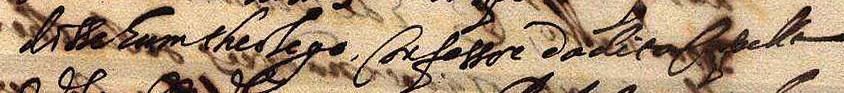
disse hum theologo, Confessor da dita Capella
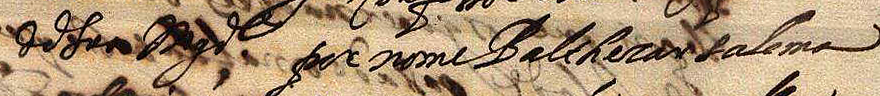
de Sua Mgde por nome Balthezar salema
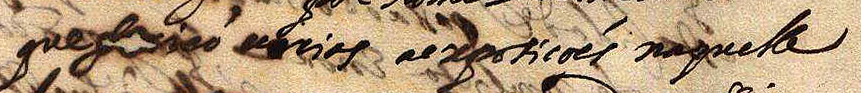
que faziaõ uarias a exposições naquelle
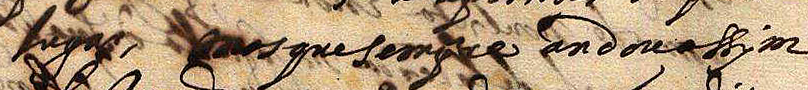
lugar, mas que sempre andou assym
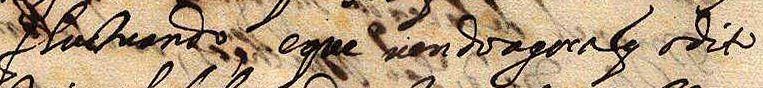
fluctuando, e que uendo agora q̄ o dito
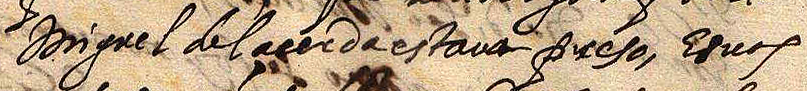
Miguel de lacerda estaua preso, E suas
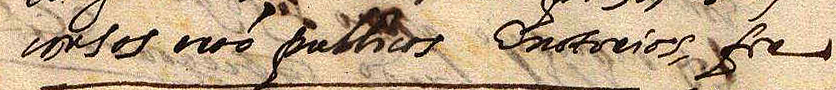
cousas eraõ publicas E notorias, for
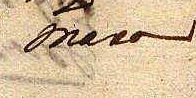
mara
